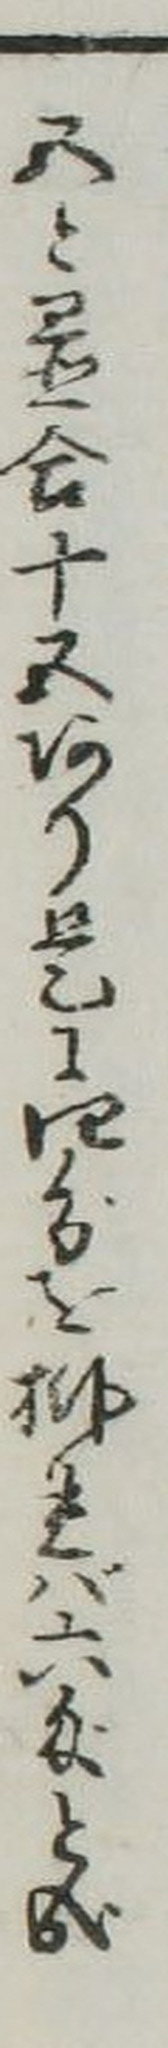五と置合十五あり是に四分を掛れば六匁と成
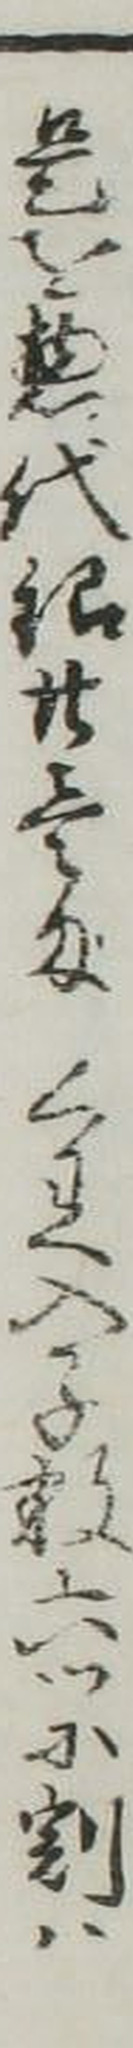是を惣代銀廿壱匁くわへ入子数六ツに割は
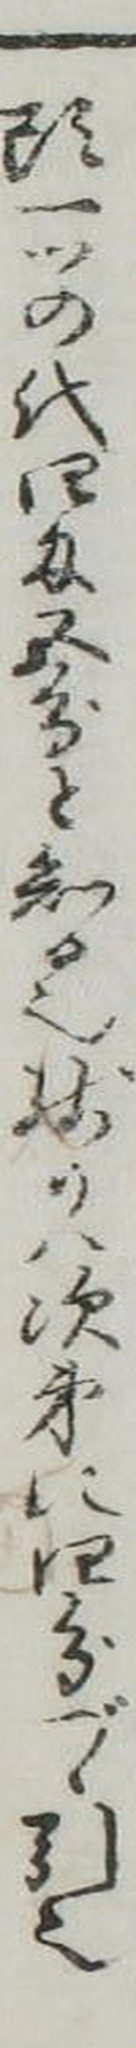頭一ツの代四匁五分と知る也残りは次第に四分づゝ引也
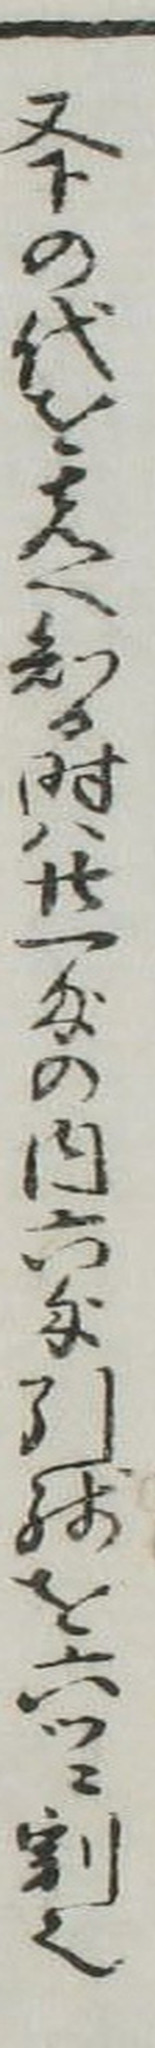又下の代を先へ知る時は廿一匁の内六匁引残を六ツに割る也
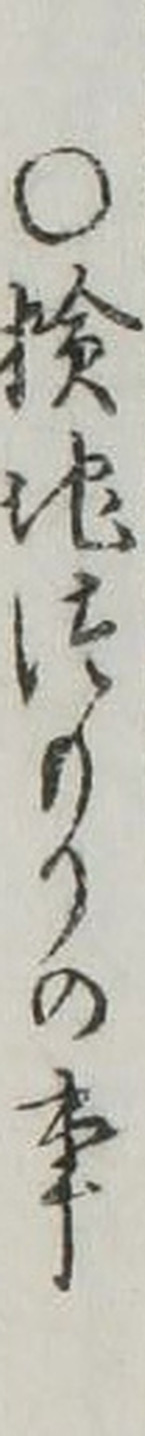○検地つもりの事
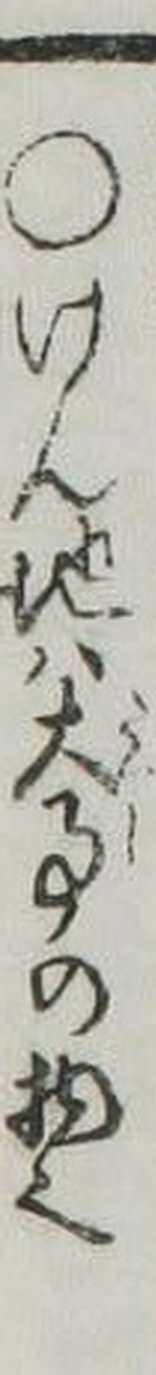○けん地は大事の物也
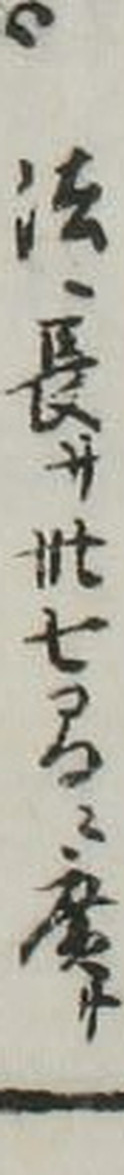法長サ卅七間に広サ
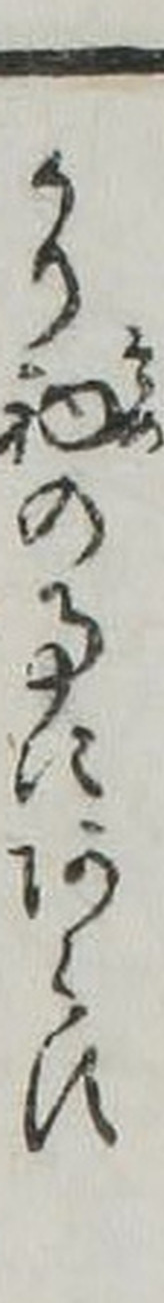かり初の事にあらす
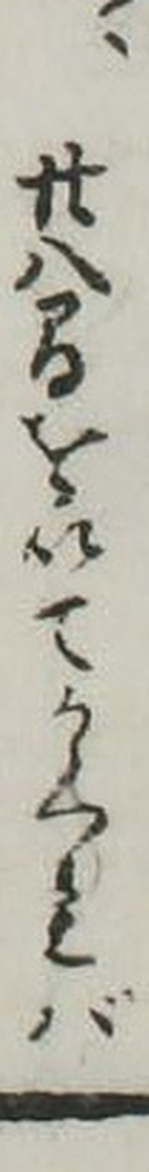廿八間を以てかくれば
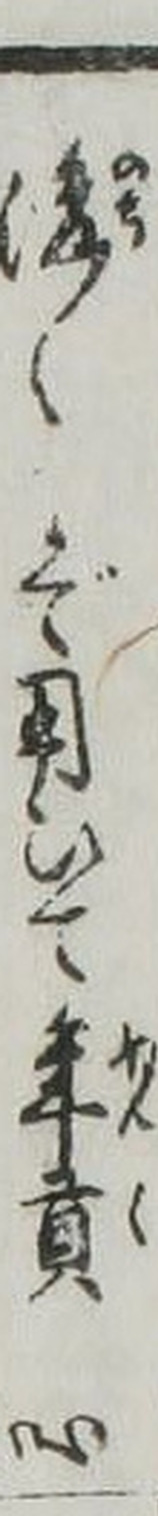後〳〵ぞ用ひて年貢
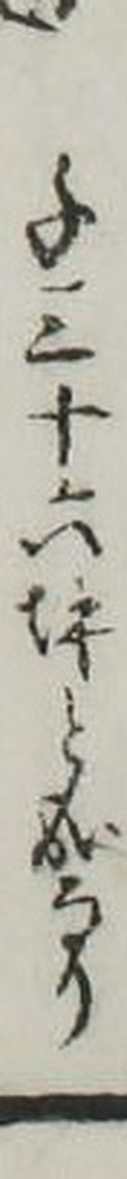千三十六坪と成なり
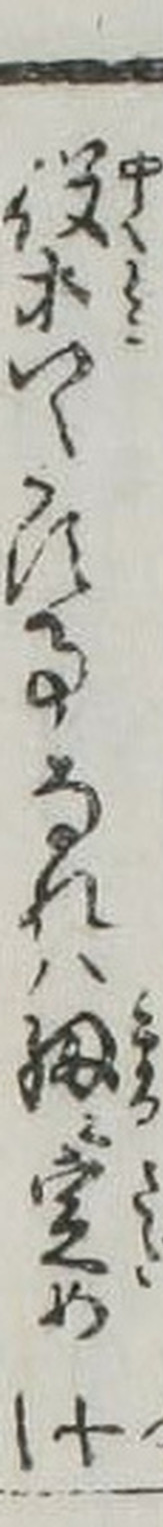役等いたす事なれは細に定め
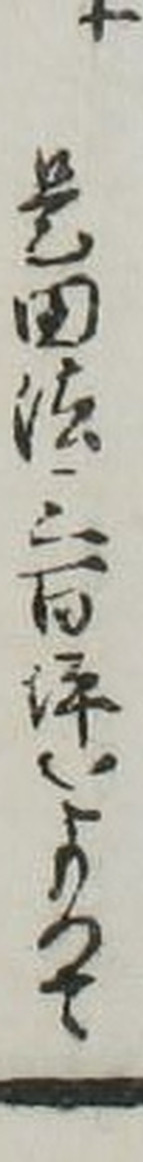是田法三百坪をもつて
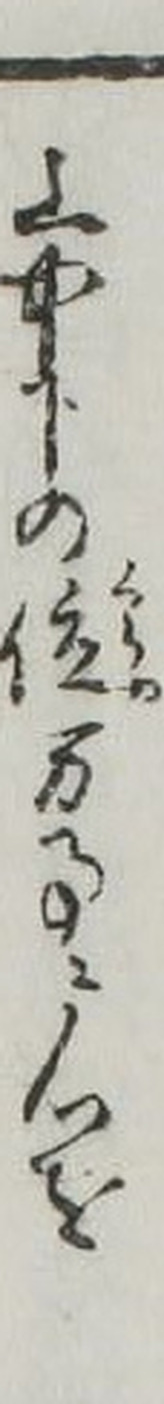上中下の位万事に心を
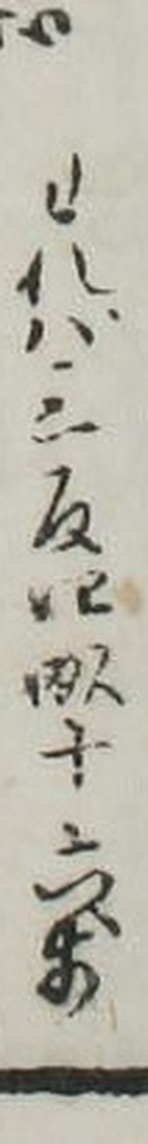われば三反四畝十六歩
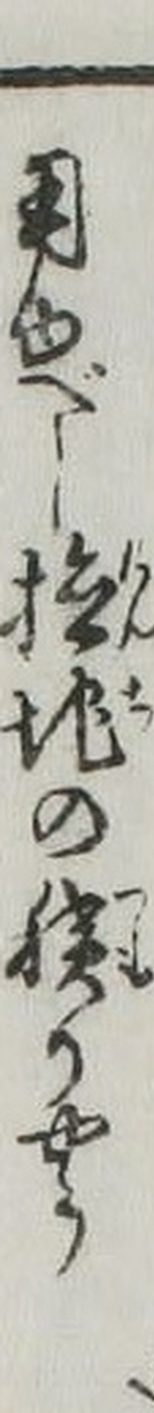用ゆべし検地の積りやう
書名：宝玉塵劫記
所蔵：東京学芸大学教育コンテンツアーカイブ
